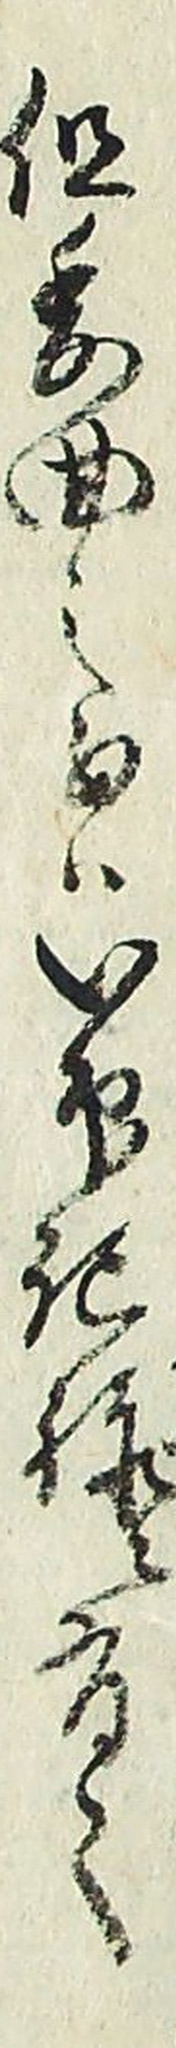但委曲の義はい印記録に有之

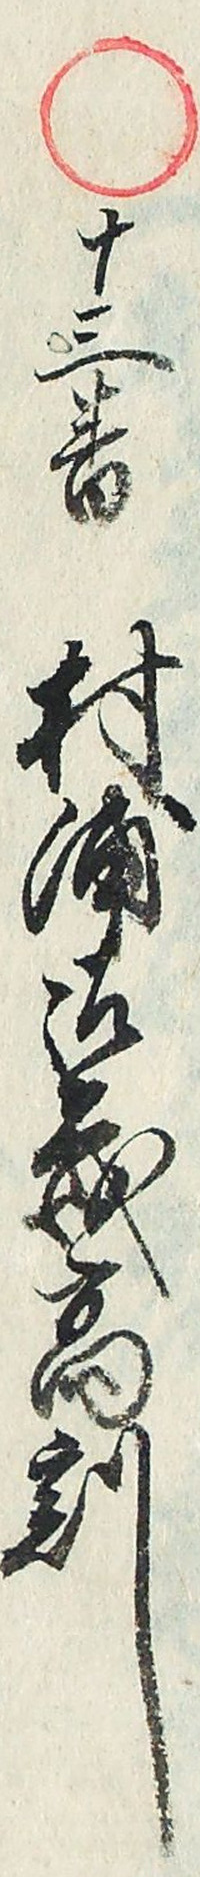十三番村浦御蔵高割
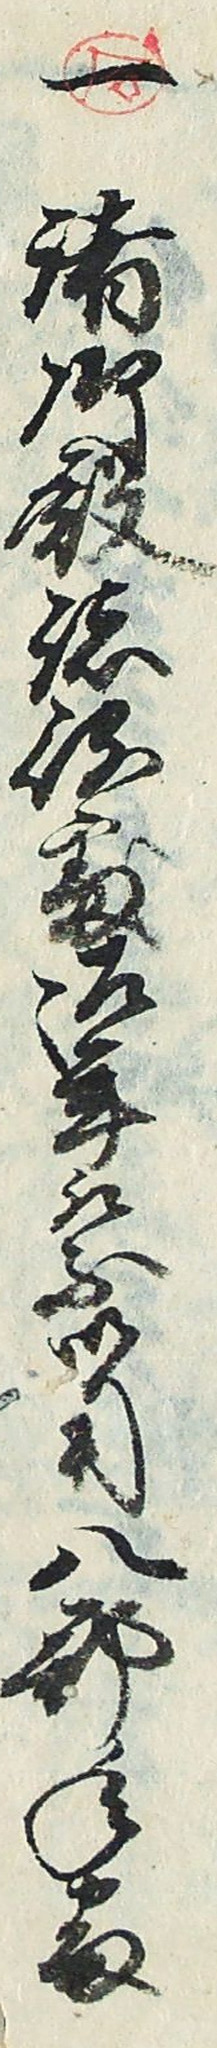一諸御殿諸役処御年祭御用八郡年番
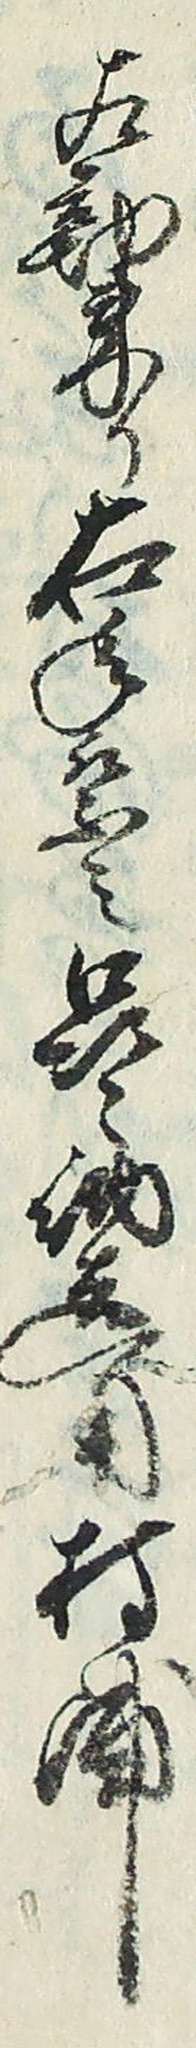相勤来り右年祭の品々納造用村浦
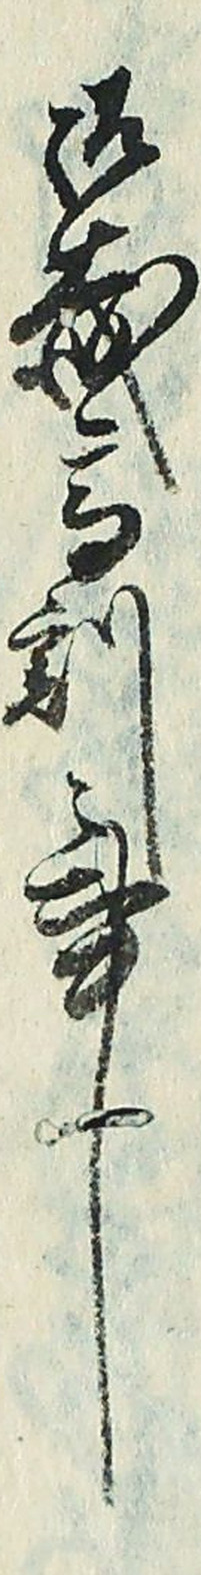御蔵高割の事
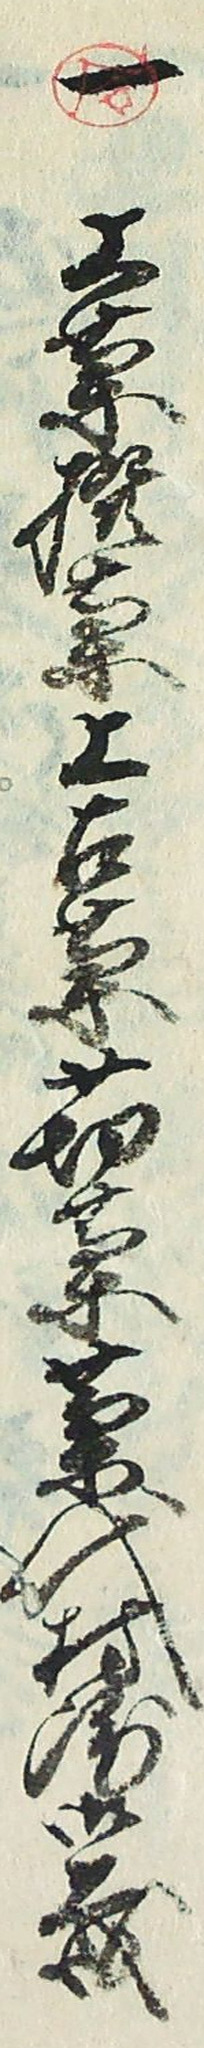一上藁撰藁上古藁苆藁藁代村浦御蔵
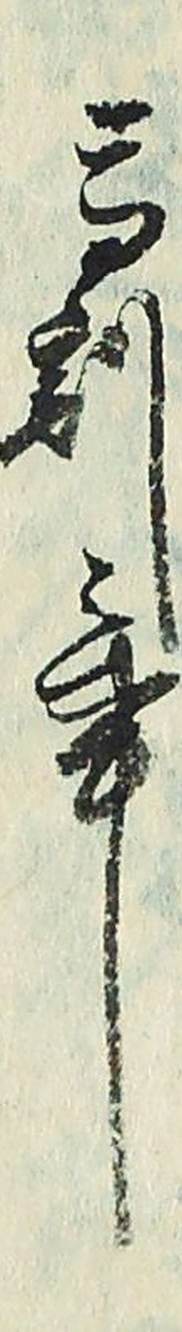高割の事
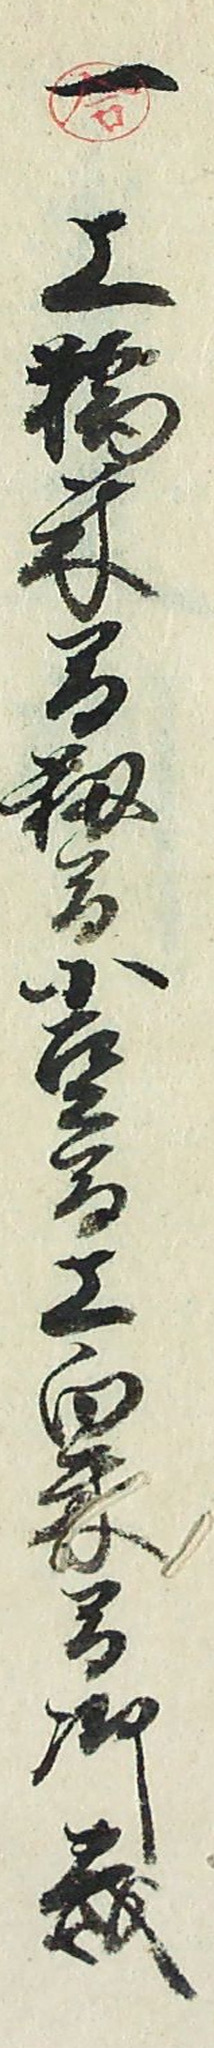一上糯米間籾間小豆間上白米間御蔵
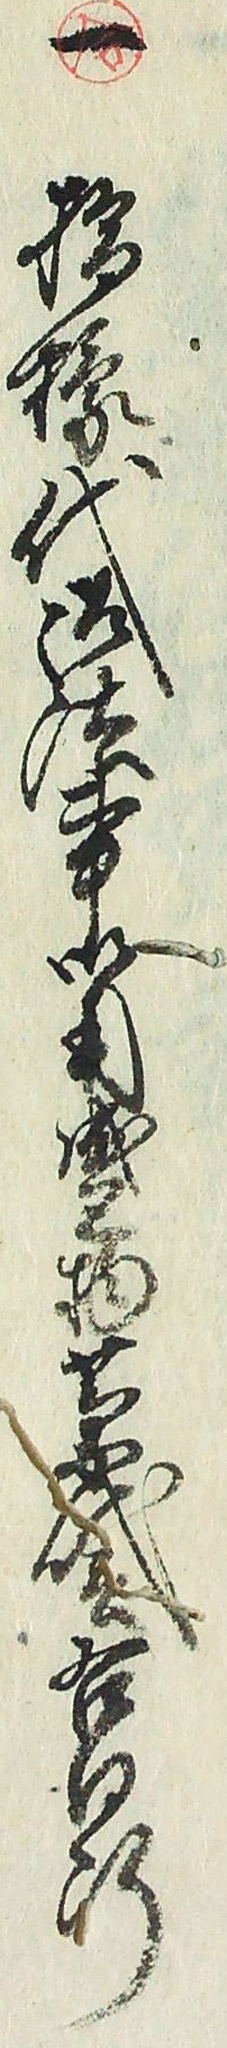一摺橡代御法事御用盛物藁代共右同断

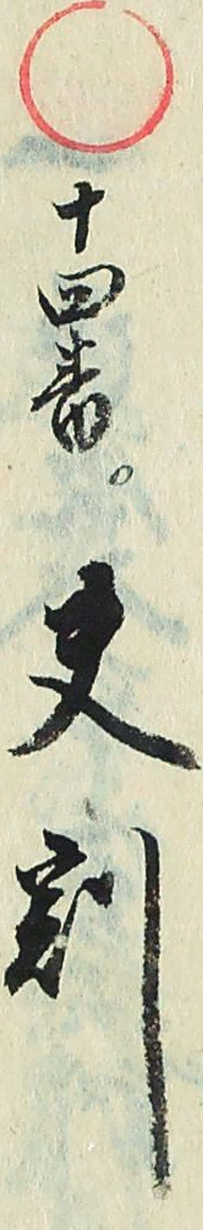十四番夫割
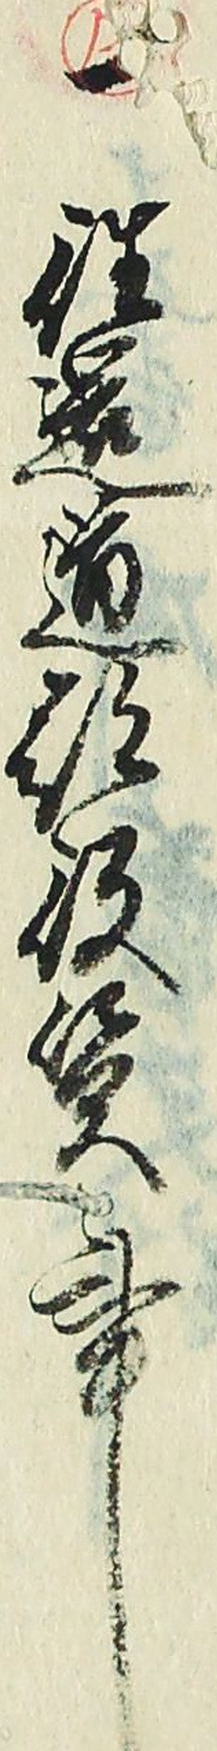一往還道郡役賃の事
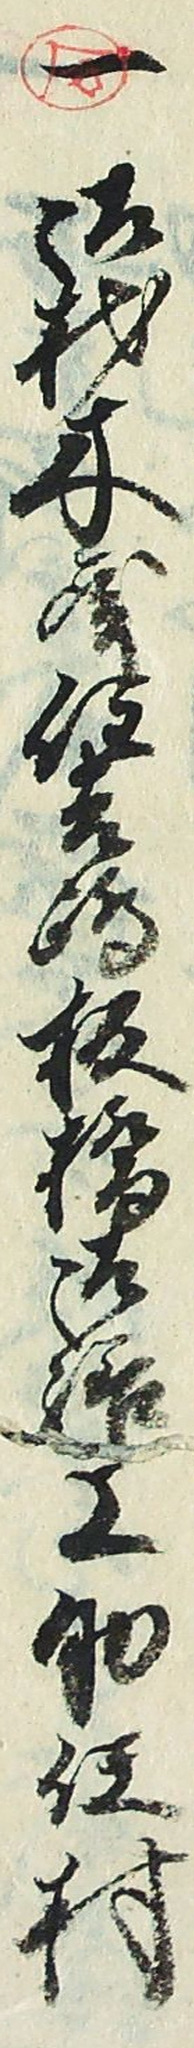一御材木屋住吉嶋板橋御繕上助任村
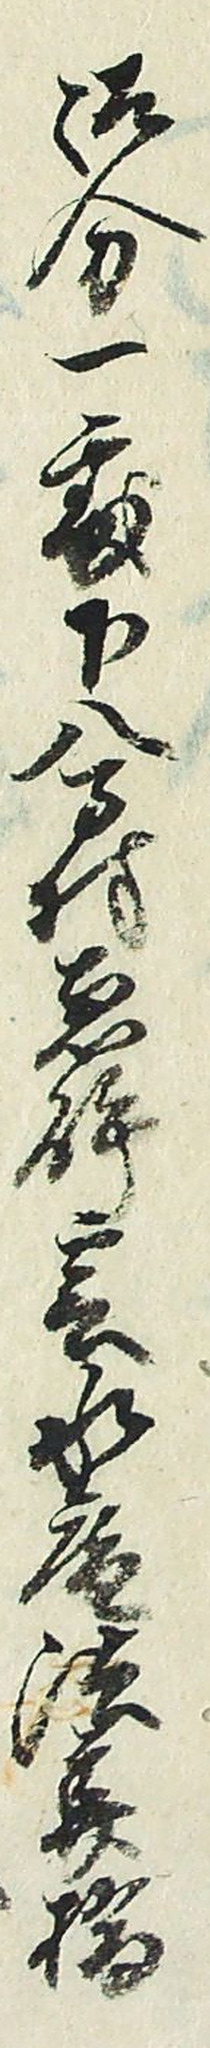御分一処下八万村恵解雲水庵法華橋
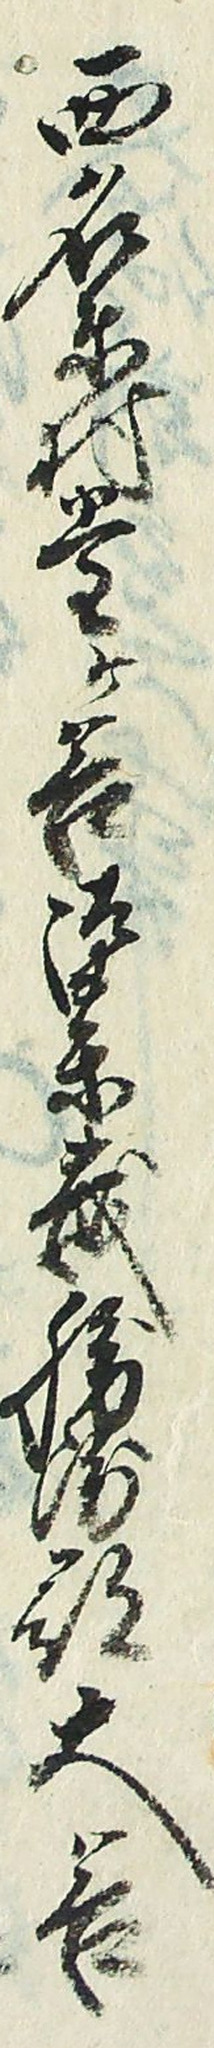西名東村堂ヶ谷御薬蔵勝浦郡大谷
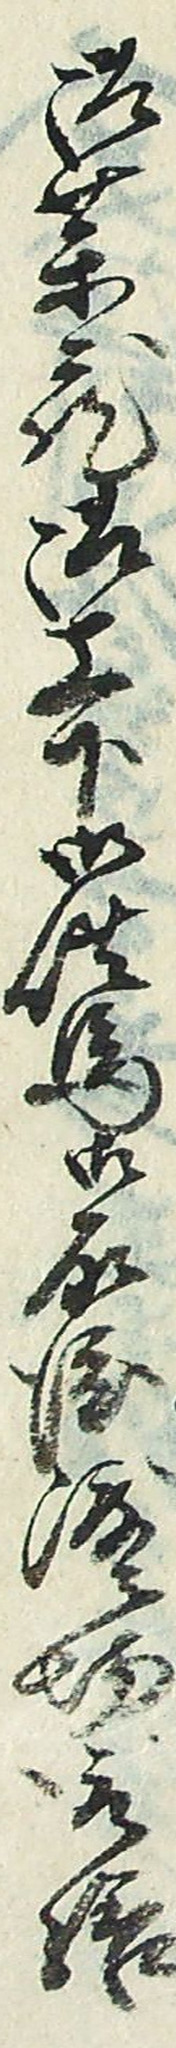御薬蔵御上下御供馬御取渡渡し場取繕

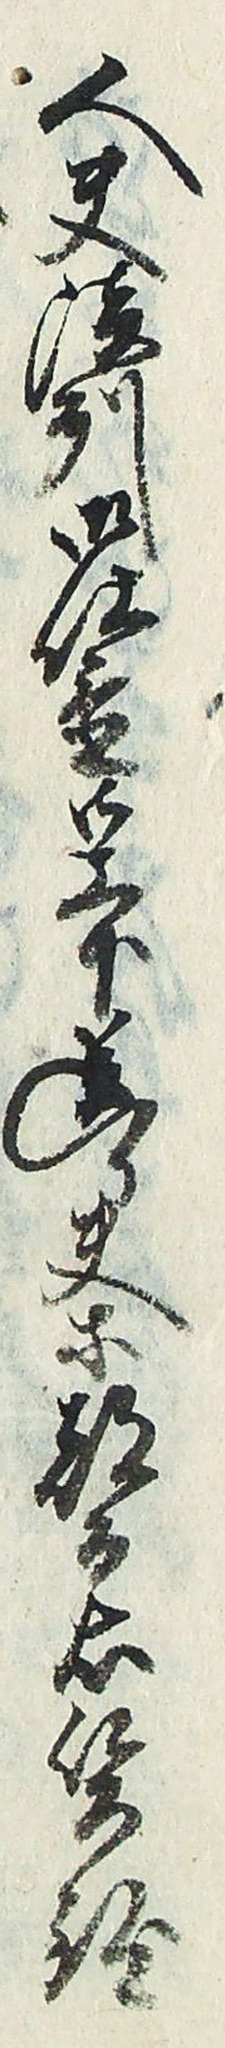人夫淡州御仕置御上下送り夫等都て右賃銀
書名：諸割賦物賃銀定記録帳
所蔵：鳴門教育大学 Naruto University of Education
